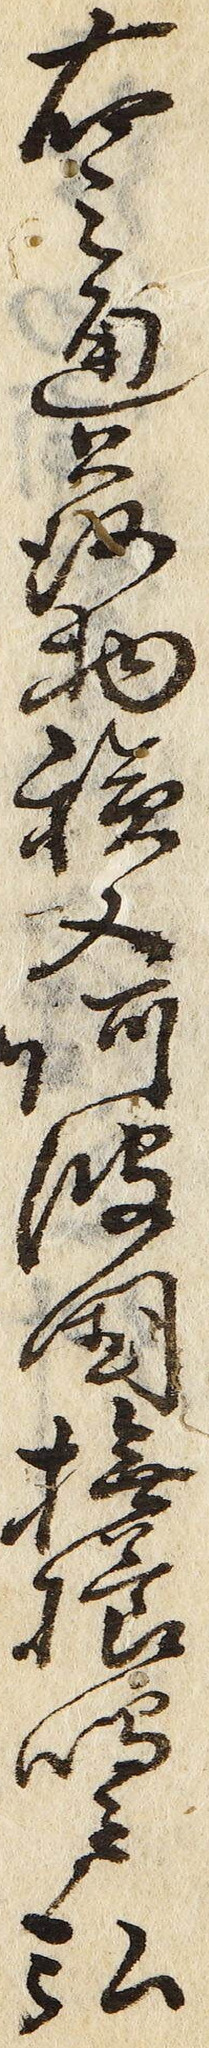右之通荷物積入阿波国撫攁鳴戸弘
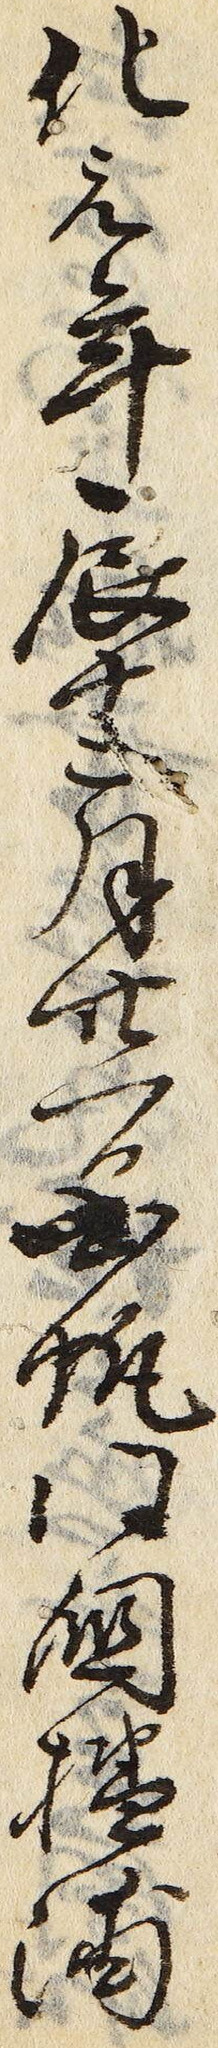化元年辰十二月廿一日出帆同国橘浦
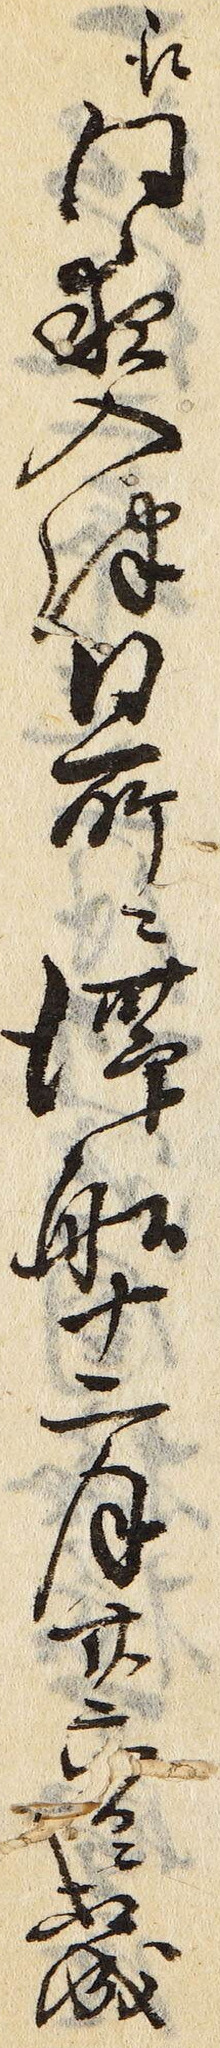江同夜入津同所ニ滞船十二月廿六日ニ相成
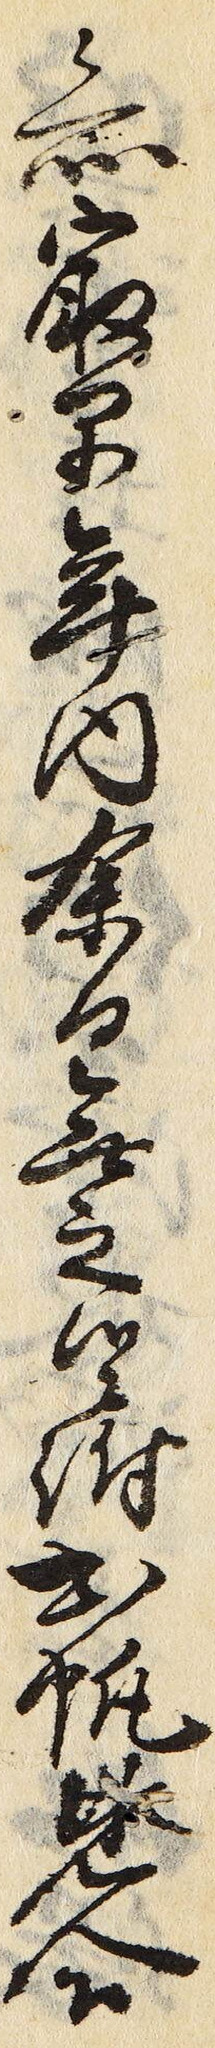候処最早年内余日無之候ニ付出帆見合
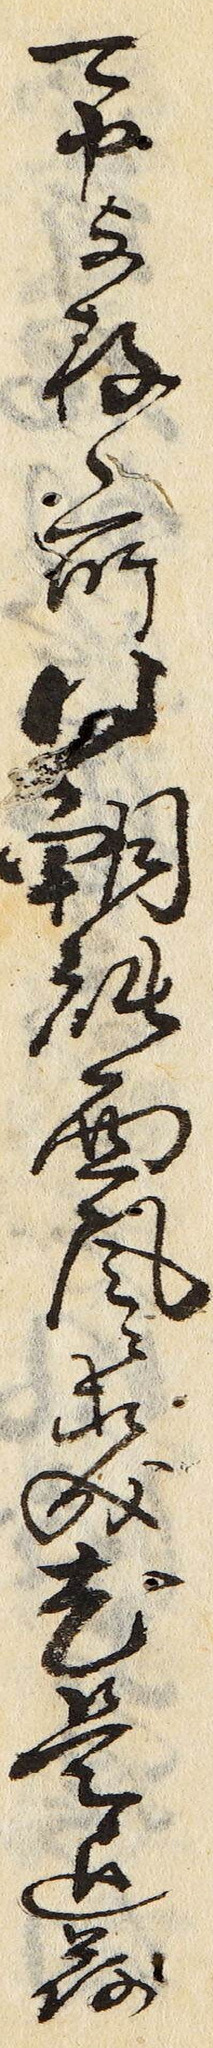可申与存候所同朝能西風ニ相成尤是迄荷
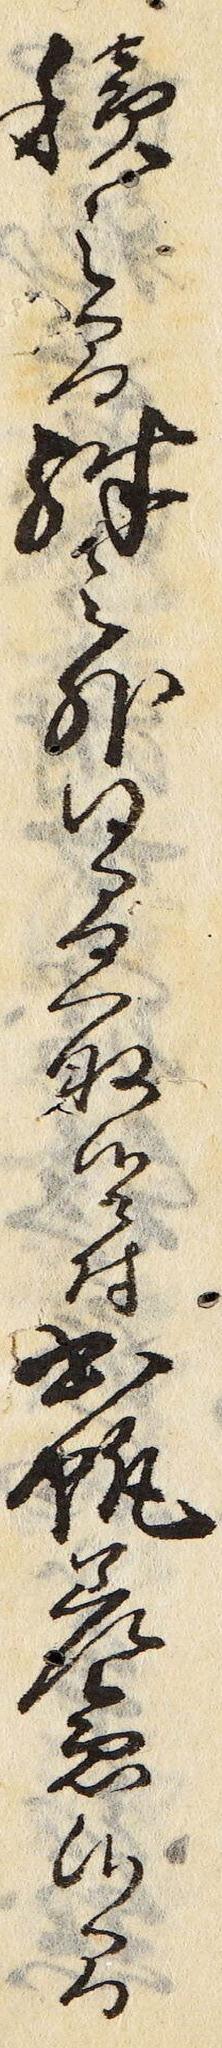積之間殊之外日間取候ニ付出帆差急候間
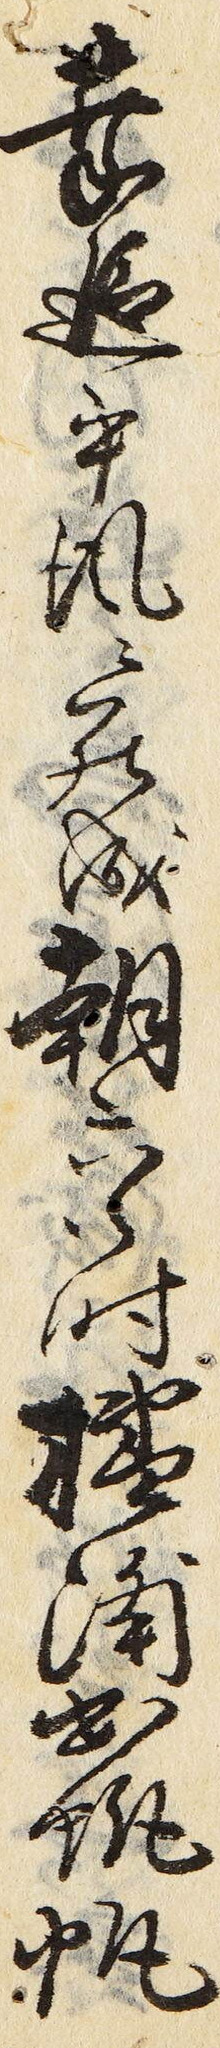幸追手風ニ罷成朝六ツ時橘浦出帆帆
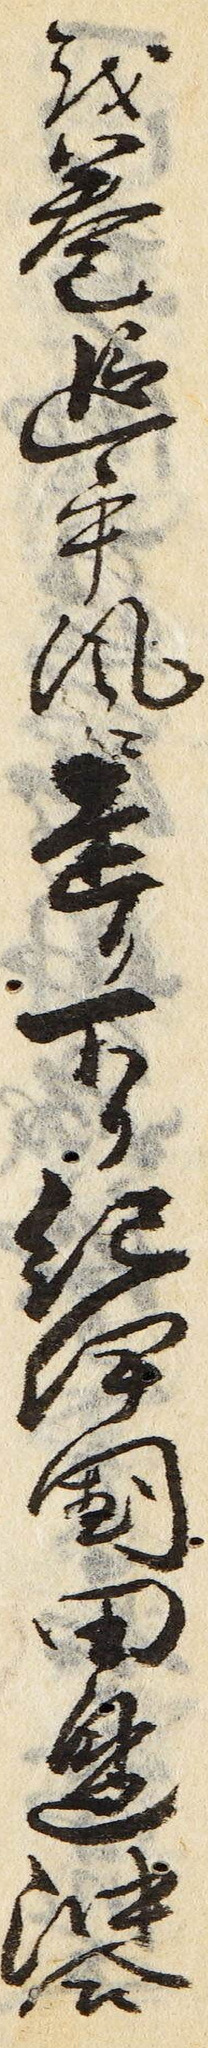を巻追手風ニ走り下り紀伊国田辺沖合
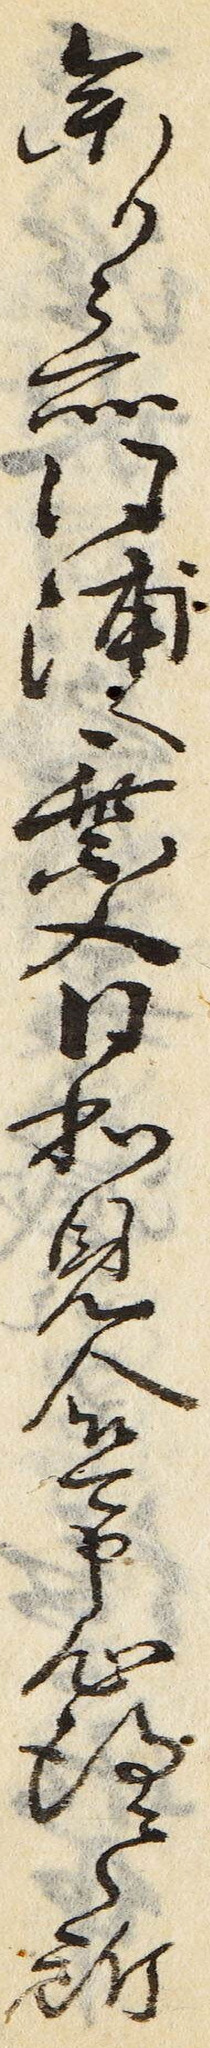参り候所同浦へ乗入日和見合可申心得ニ候所
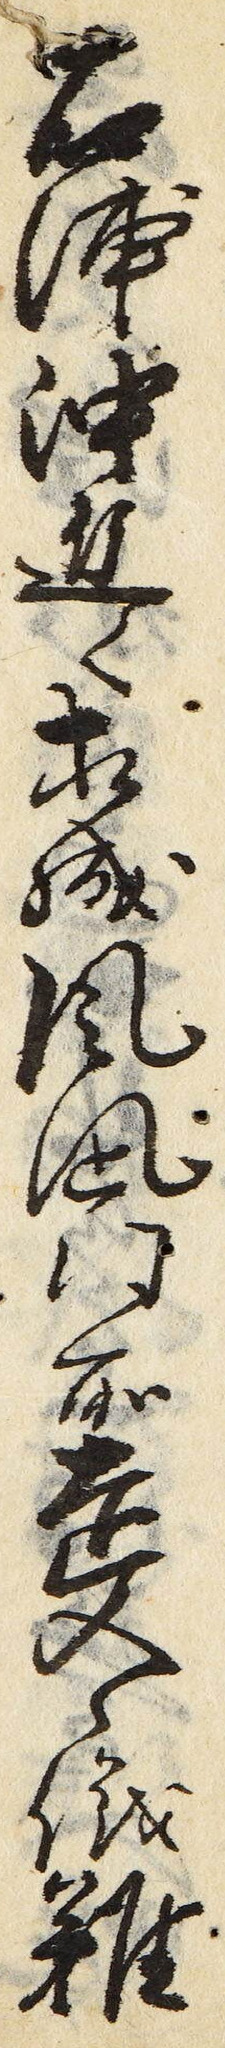右浦沖近く相成風凪同所走入候儀難
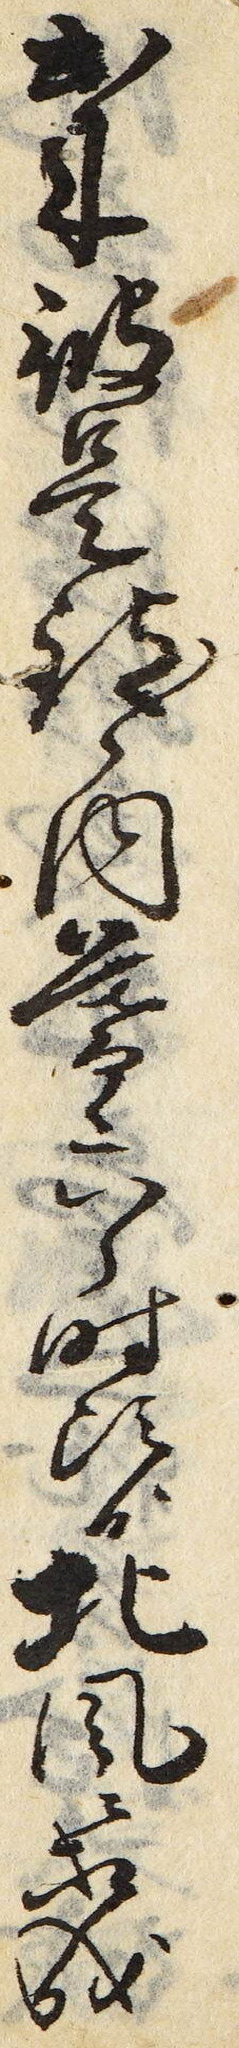出来彼是致候内暮六ツ時頃ゟ北風ニ相成
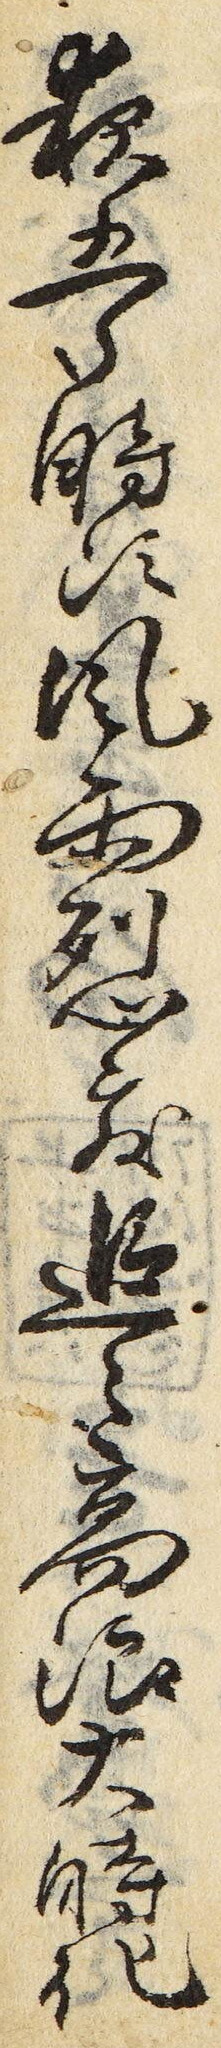夜五ツ時頃風雨烈敷追々高浪大時化

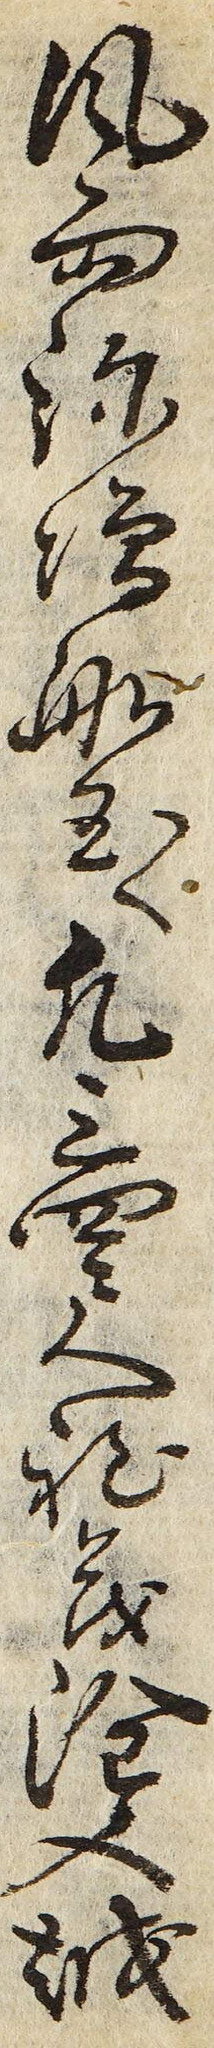風雨弥増船玉へ凡三四尺程も注入を
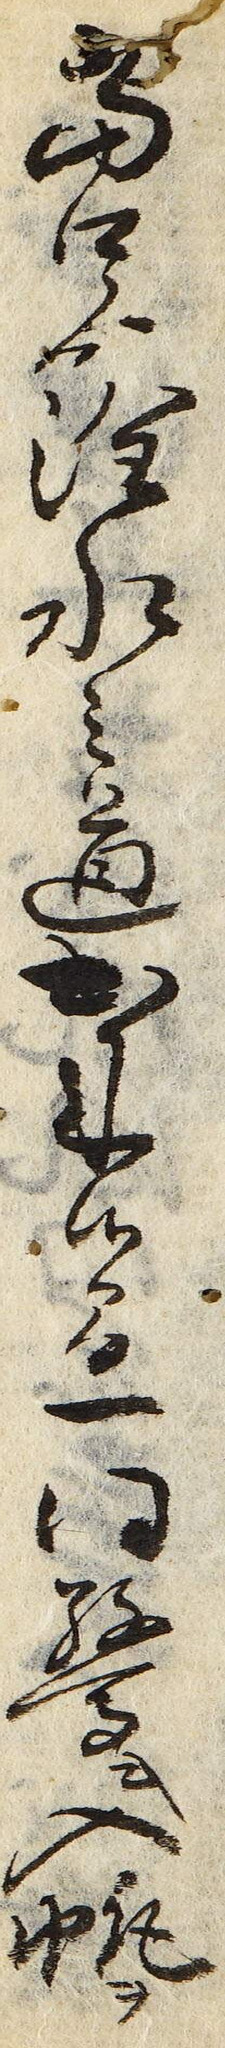当口ゟ注水之道出来候間一同驚キ入帆ヲ
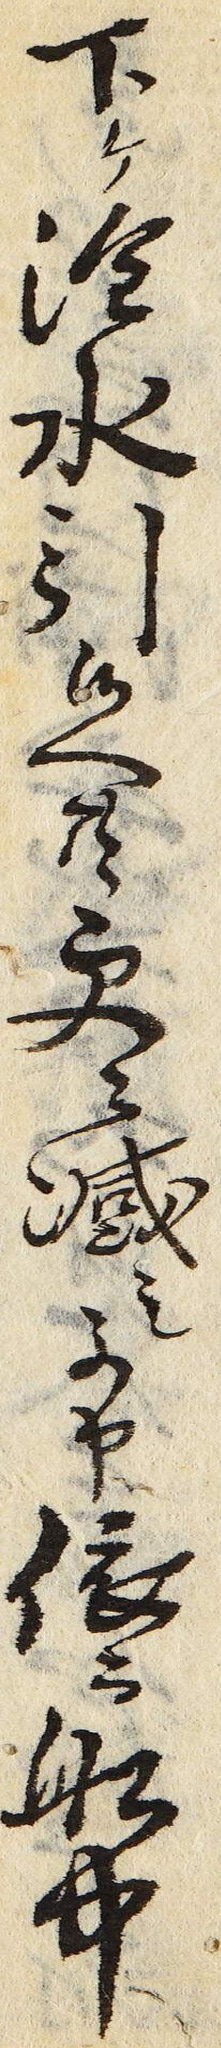下ケ注水引候へ共更ニ減シ不申依而船中
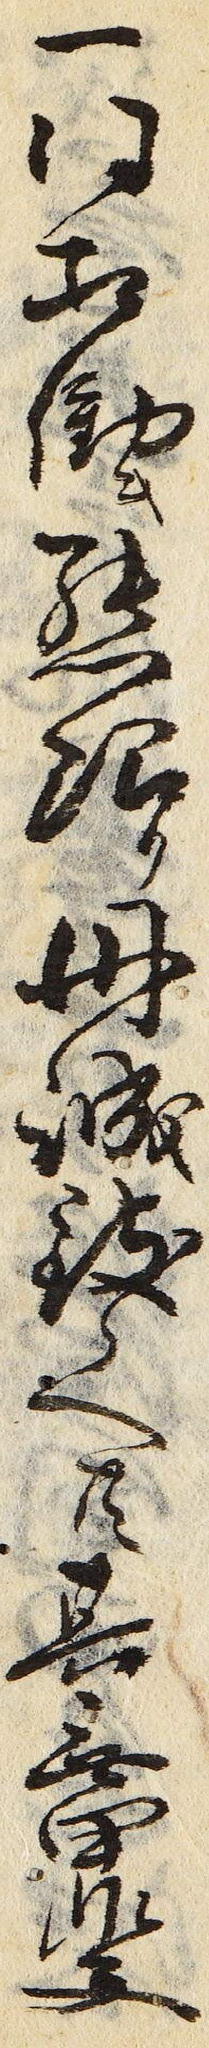一同相働キ態限り丹誠致候へ共其無甲斐
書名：阿波幸宝丸漂流記
